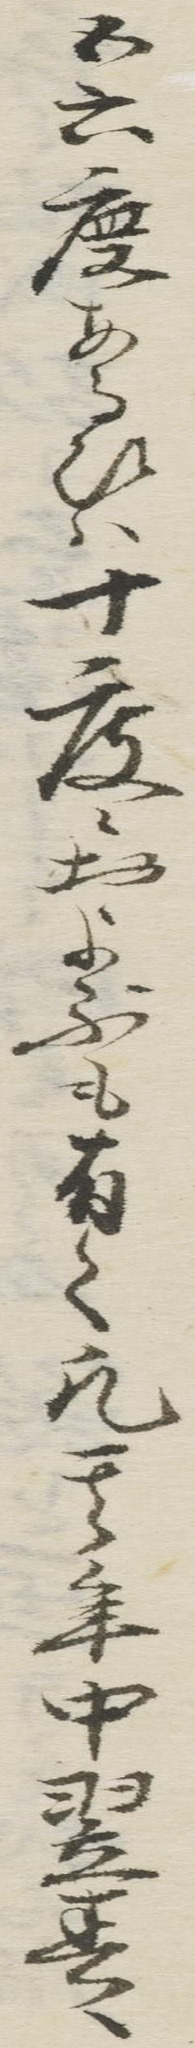五六度あるひハ十度ニおよぶも有之凡其年中翌春へ
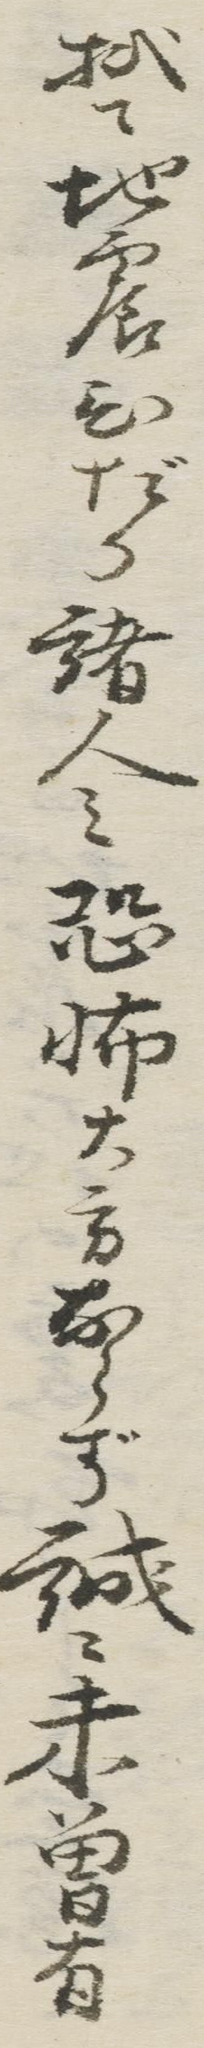掛て地震ひだり諸人之恐怖大方ならず誠ニ未曾有
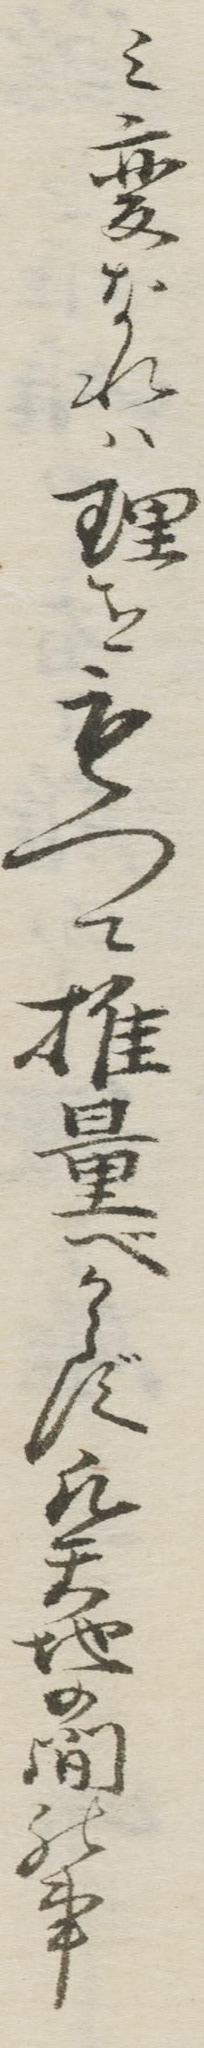之変なれハ理をもつて推量べからず凡天地の間の事
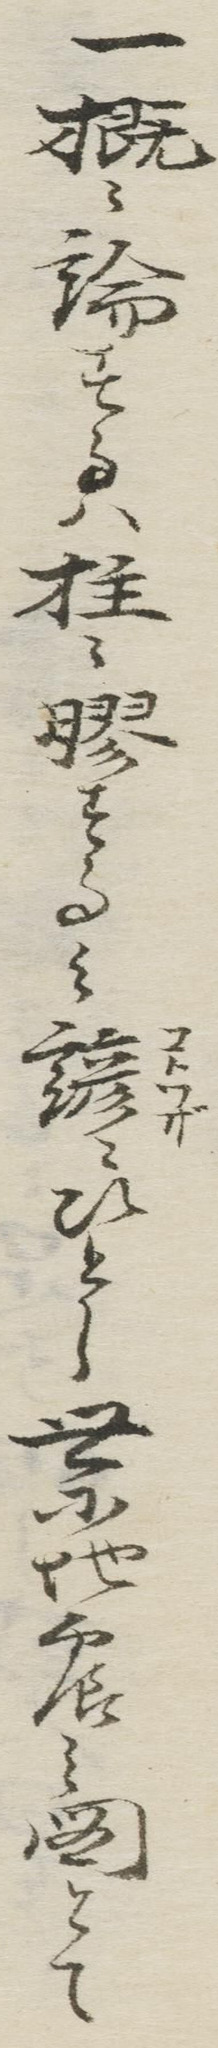一概ニ論ずるハ桂々膠する之諺ニひとし世に地震之図とて
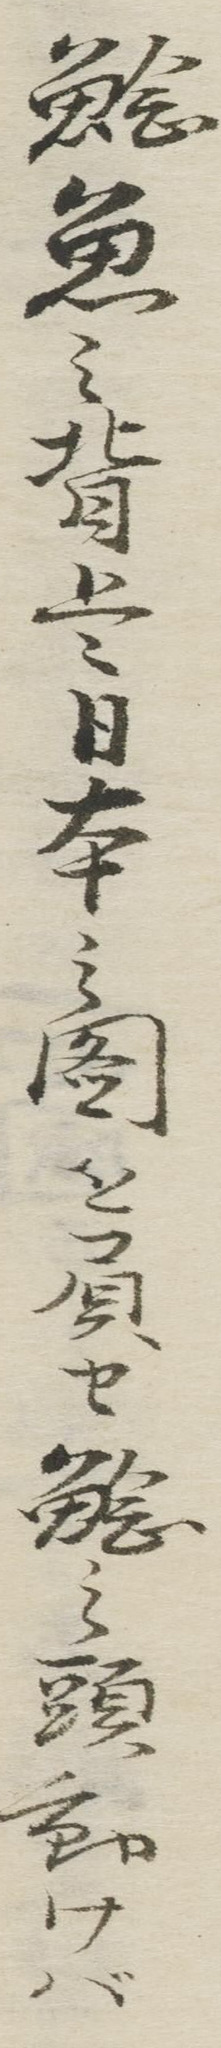鯰魚之背上ニ日本の国を負セ鯰之頭動けバ

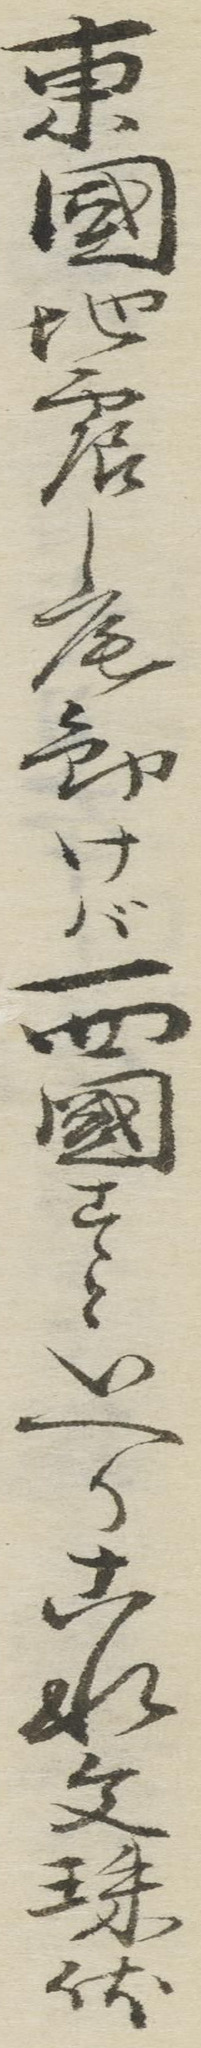東国地震の尾動けバ西国すといへりこれ文殊伏
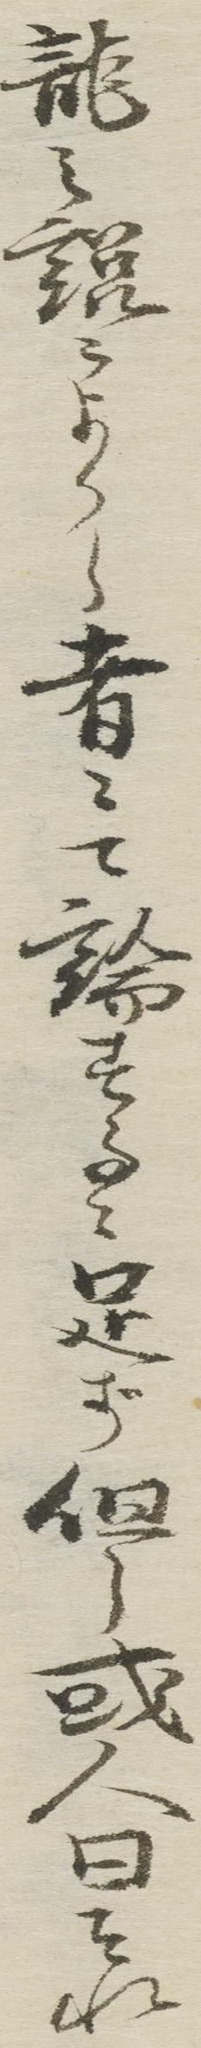龍之説ニよりし者ニて論するニ足ず但し或人曰それ
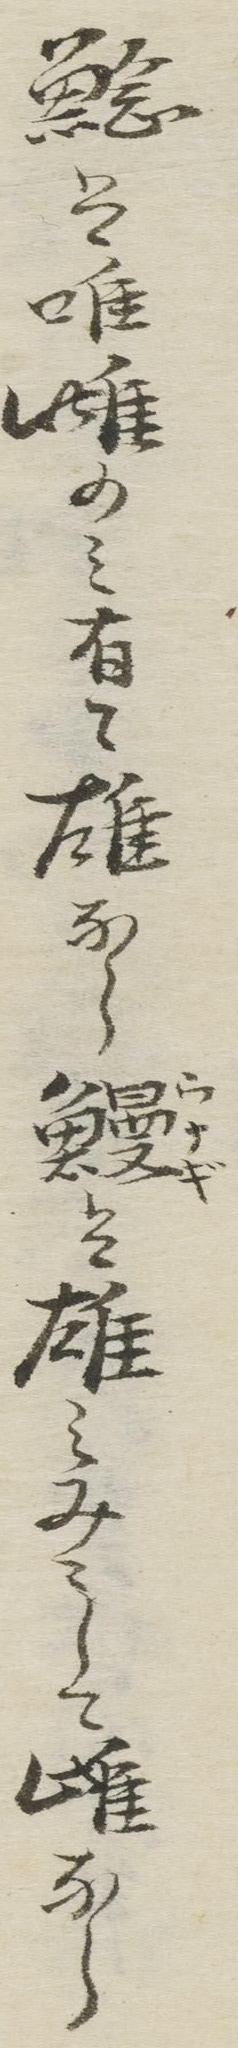鯰は唯雌のミ有て雄なし鰻は雄之みニして雌なし
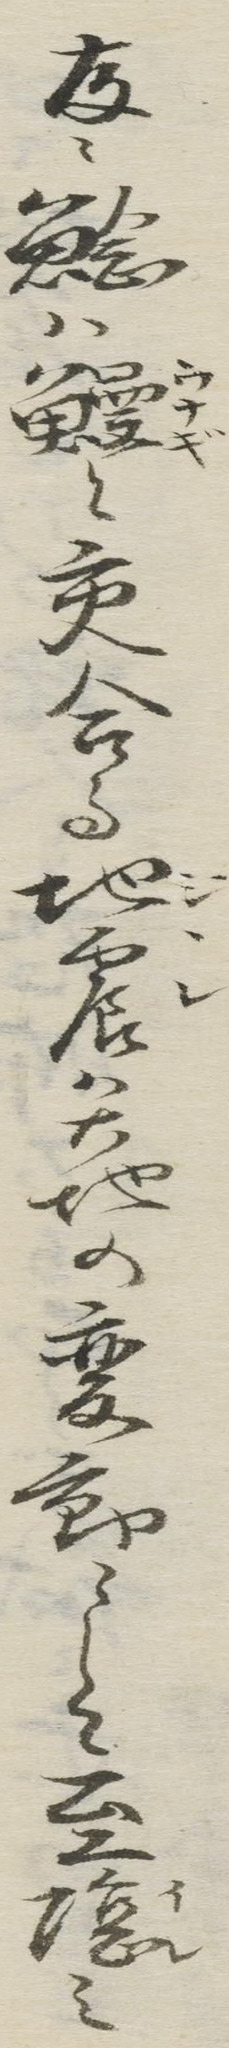故ニ鯰ハ鰻と交合る地震ハ大地の変動ニして至陰之
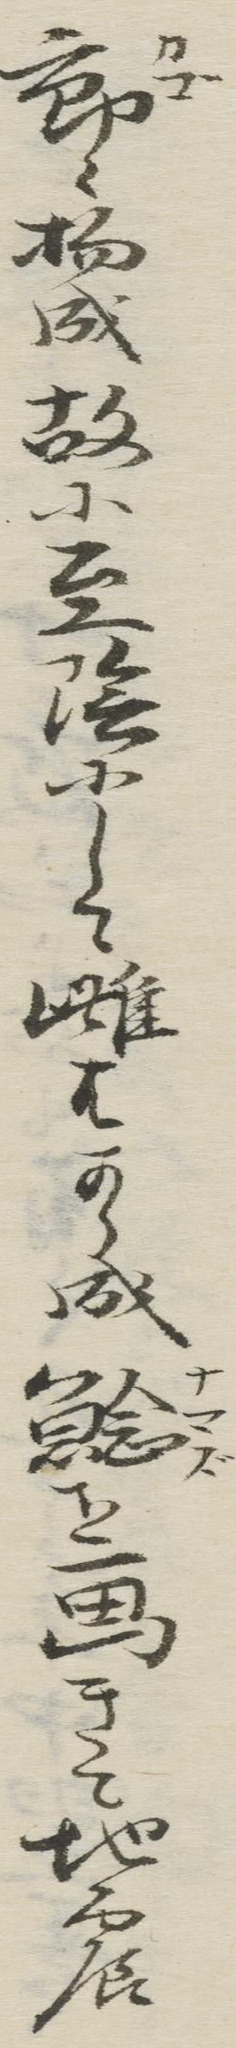動く物成故に至陰にして雌は可成鯰を画きて地震
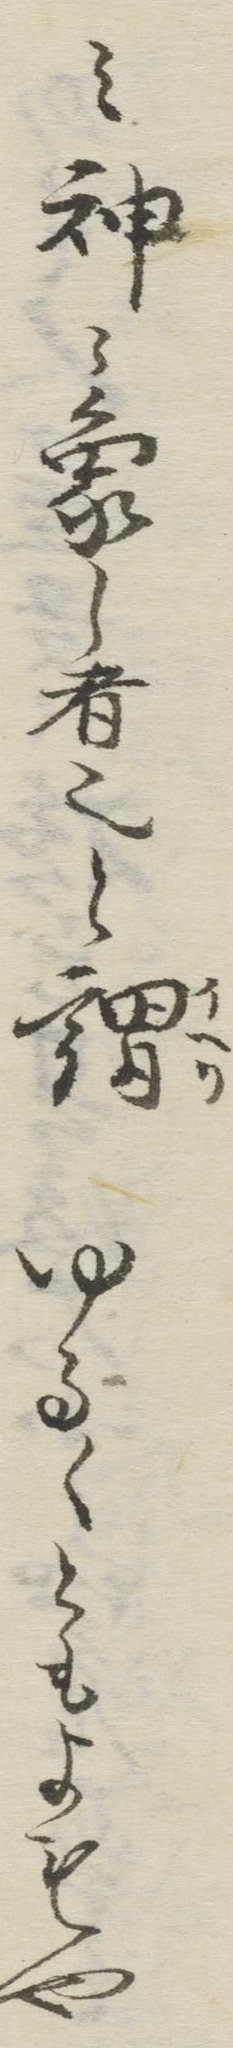之神ニ象し者也と謂ゆるくともよもや
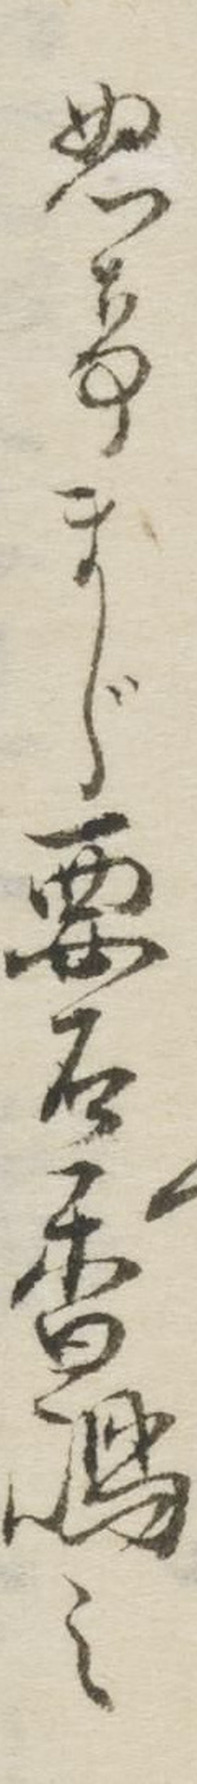ぬけまじ要石香嶋之
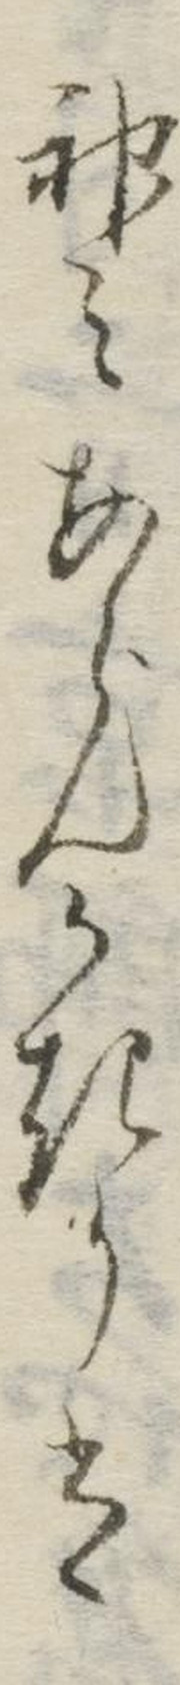神のあらんかぎりは
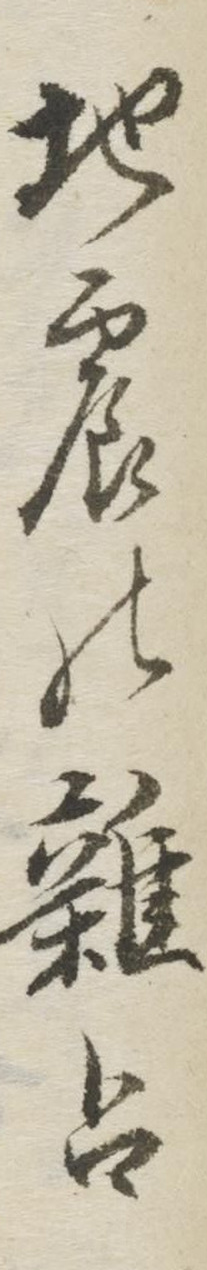地震の雑占
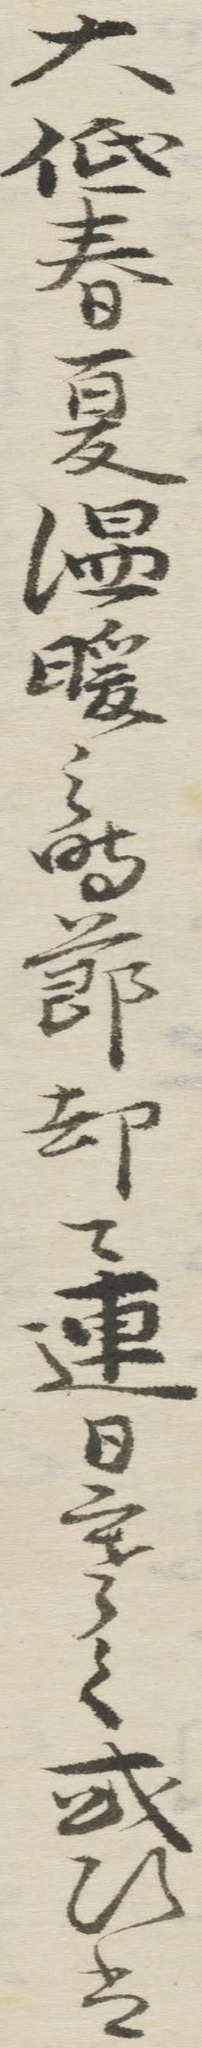大抵春夏温暖之時節却て連日寒て或ひは
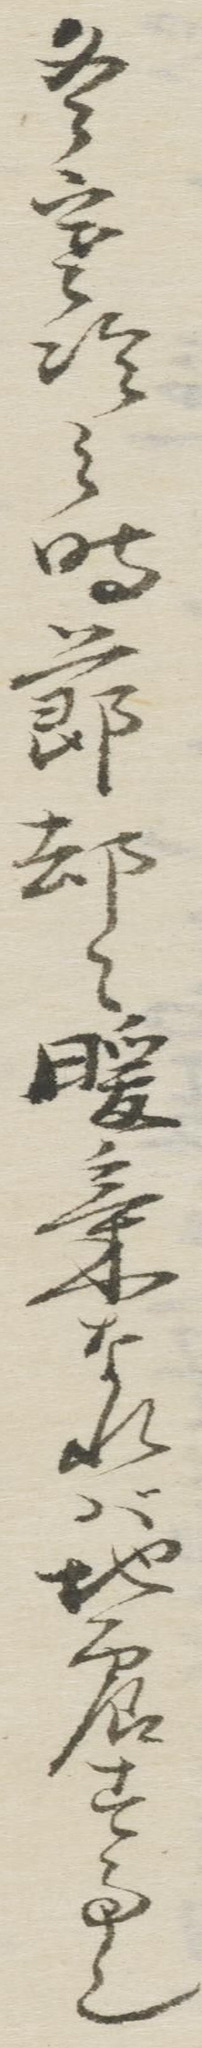冬寒冷之時節却て暖気なれバ地震する也
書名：諸国大地震大津波一代記
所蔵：東京大学地震研究所図書室 Earthquake Research Institute Library, The University of Tokyo, JAPAN
